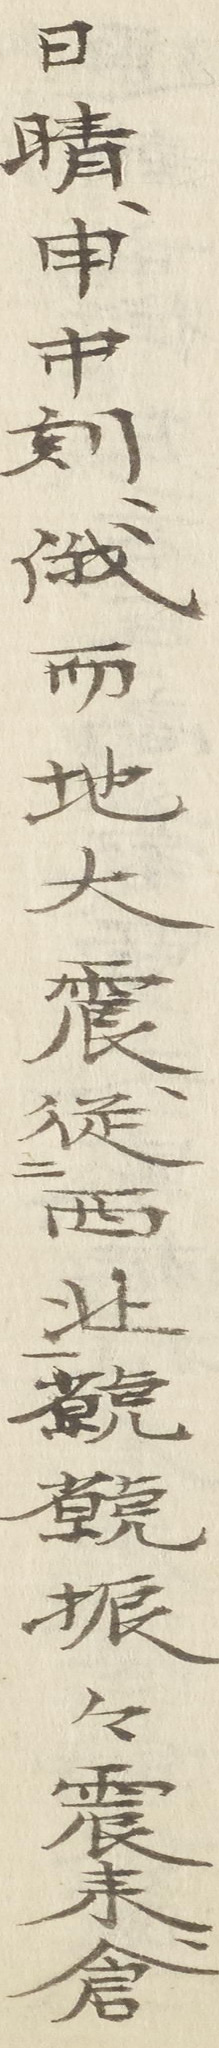日晴、申中刻、俄而地大震、従西北虩虩振々震来、倉
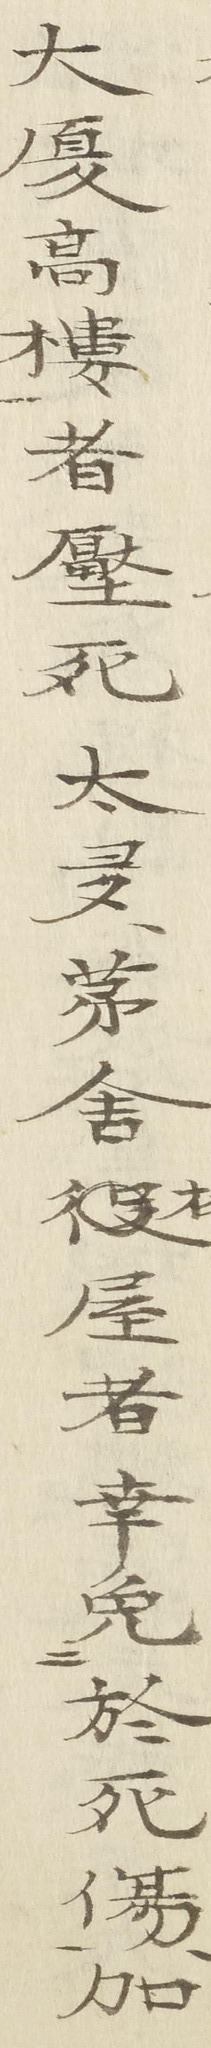大厦高楼者圧死太多、苐舎板屋者幸免於死傷、加

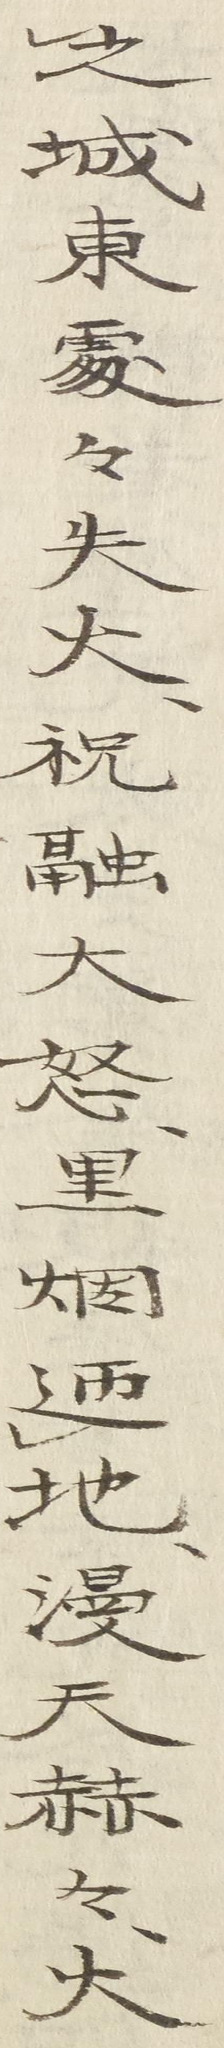之城東処々失火、祝融大怒、黒烟這地、漫天赫々、火
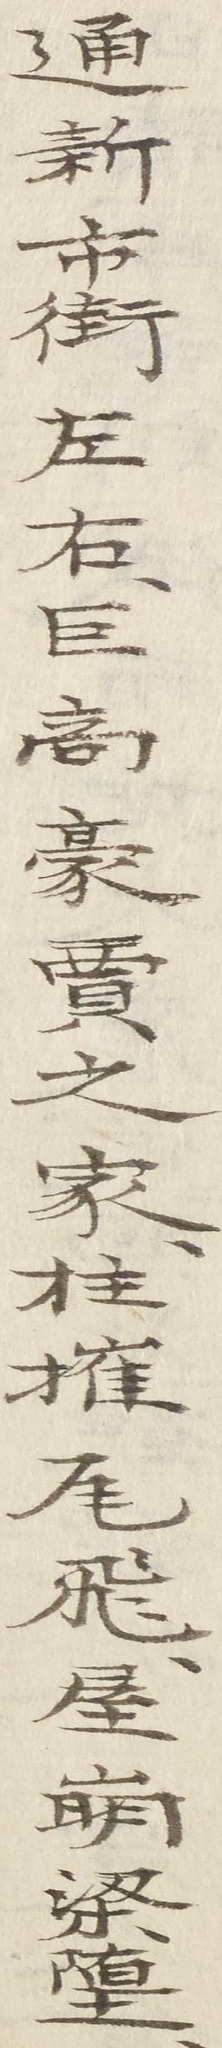通新市街左右、巨商豪賈之家、桂摧尾飛、屋崩梁堕、
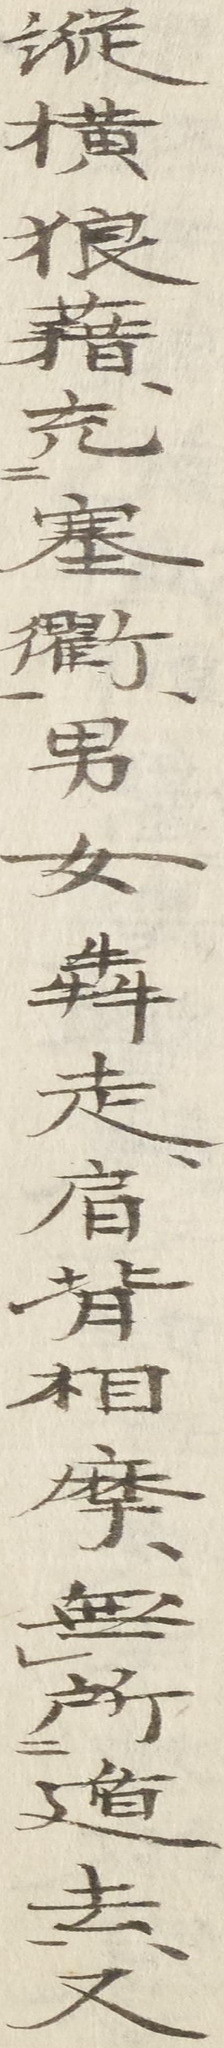縦横狼藉、充塞衛、男女犇走、肩脊相摩、無所遁去、又
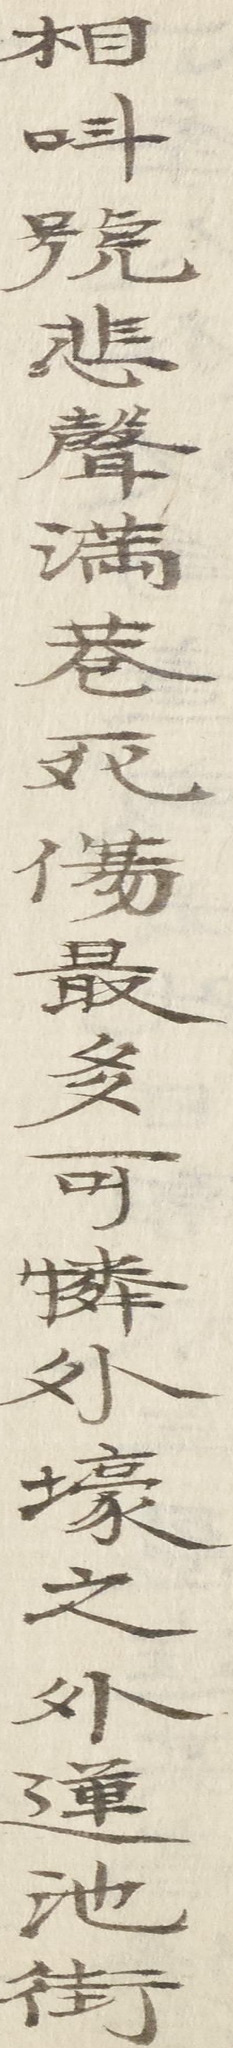相叫號悲声満巷死傷最多可憐外壕之外蓮池街
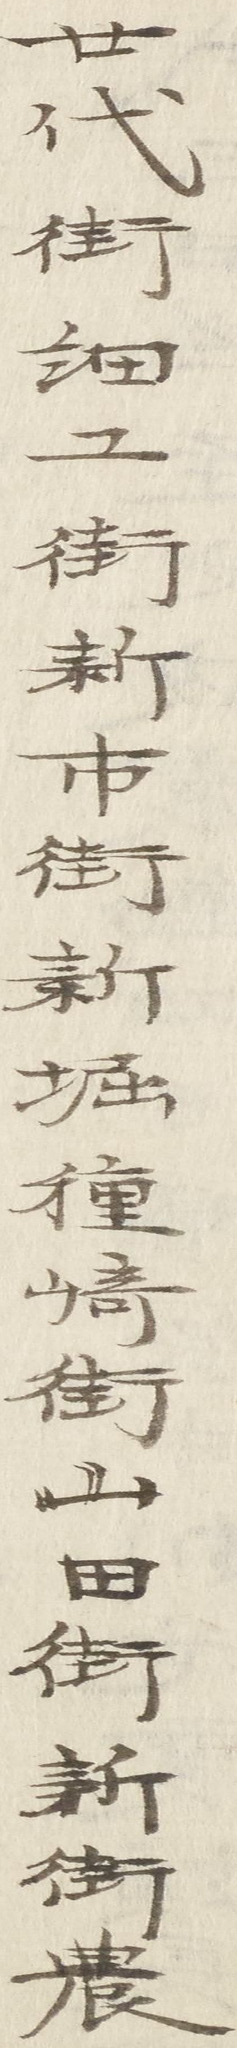廿代街細工街新市街新堀種崎街山田街新街農
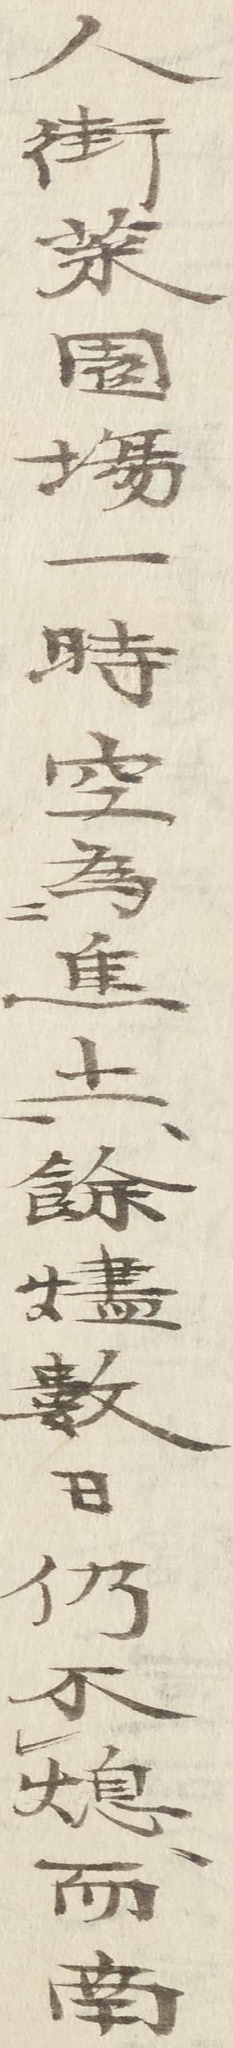人街菜園場一時空為焦土、餘燼数日仍不熄、而南
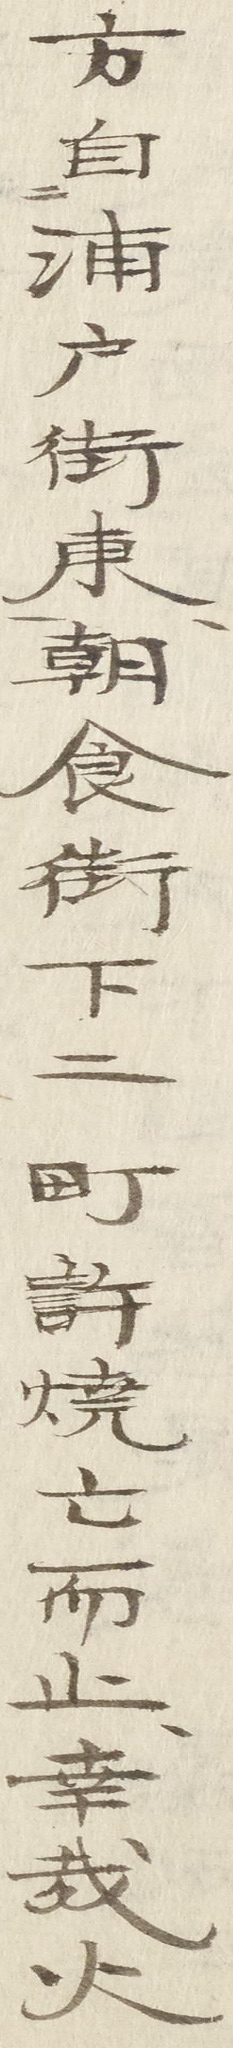方自浦戸街東、朝食街下二町許焼亡而止、幸哉火
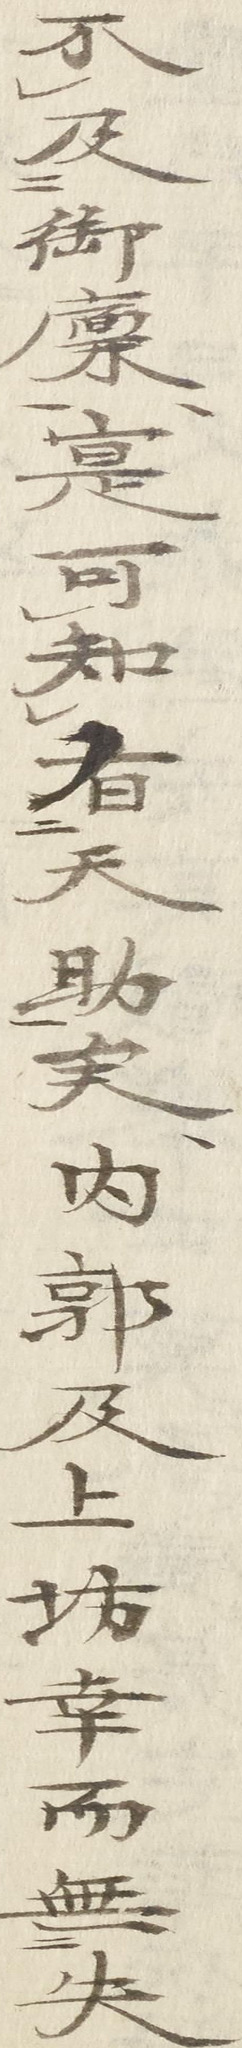不及御廩、寔可知者天助実、内郭及上坊幸而無失
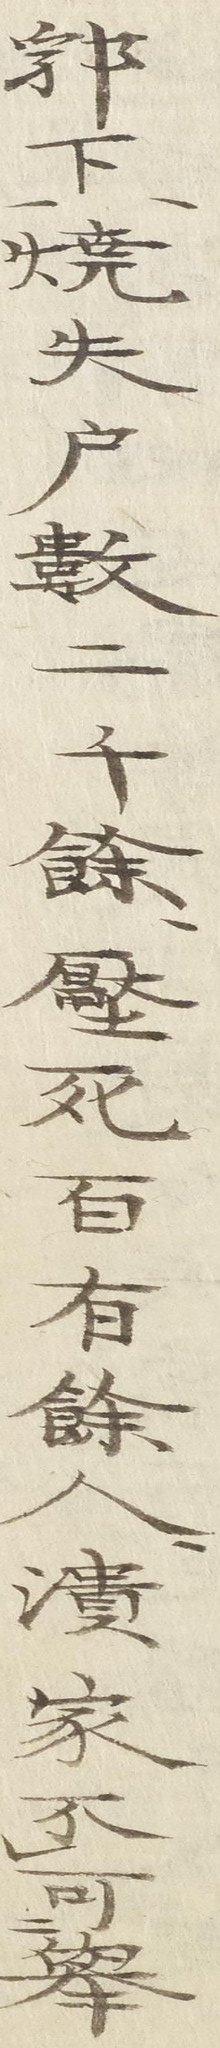郭下、焼失戸数二千餘戸、圧死百有餘人、潰家不可挙
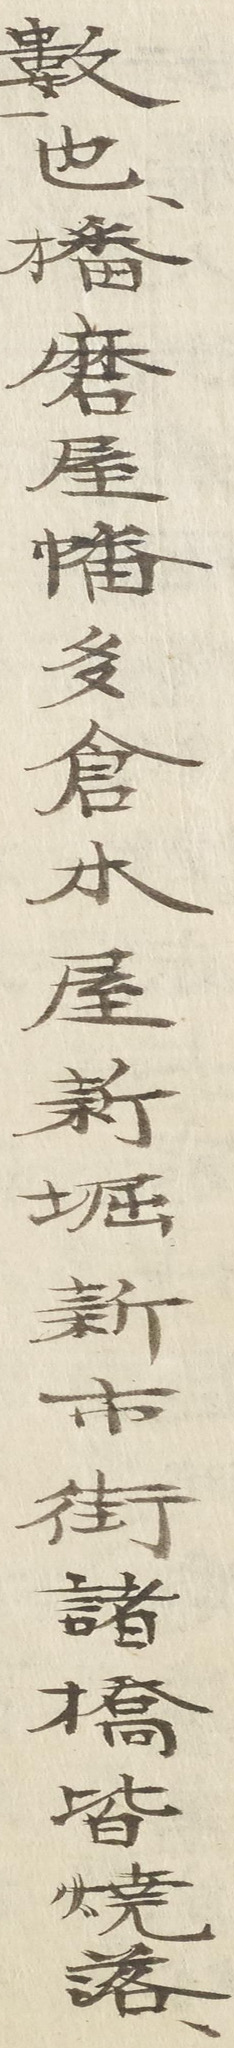数也、播磨屋幡多倉木屋新堀新市街諸橋皆焼落、
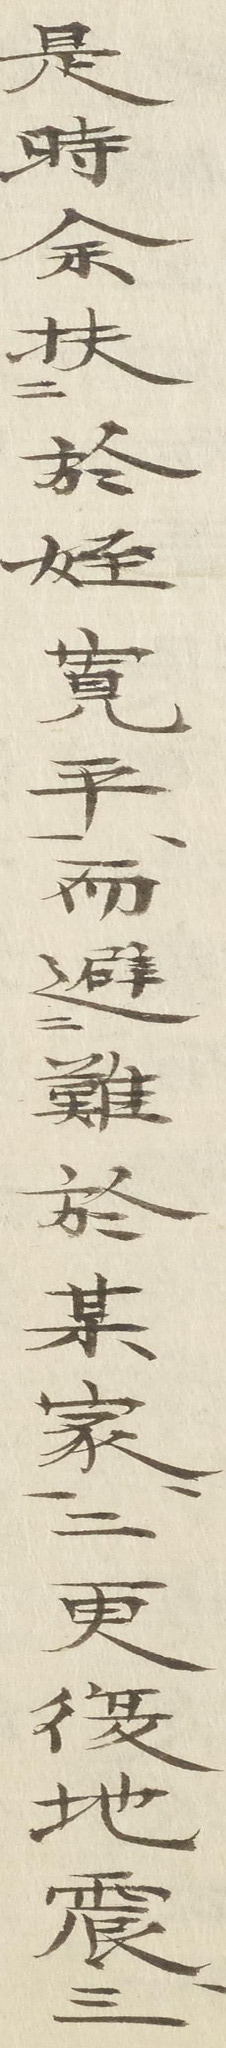是時余扶於姪寛平、而避難於某家、二更復地震、三
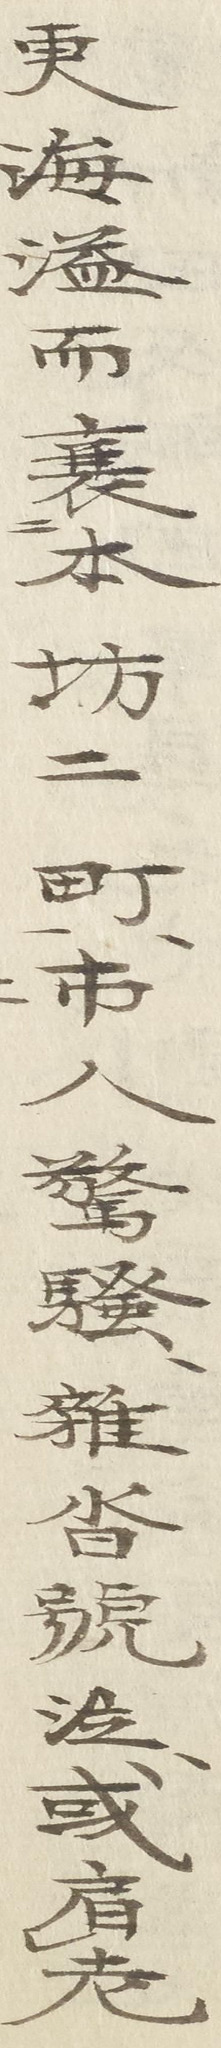更海溢而裏本坊二町、市人驚騒、雑沓號泣、或肩老
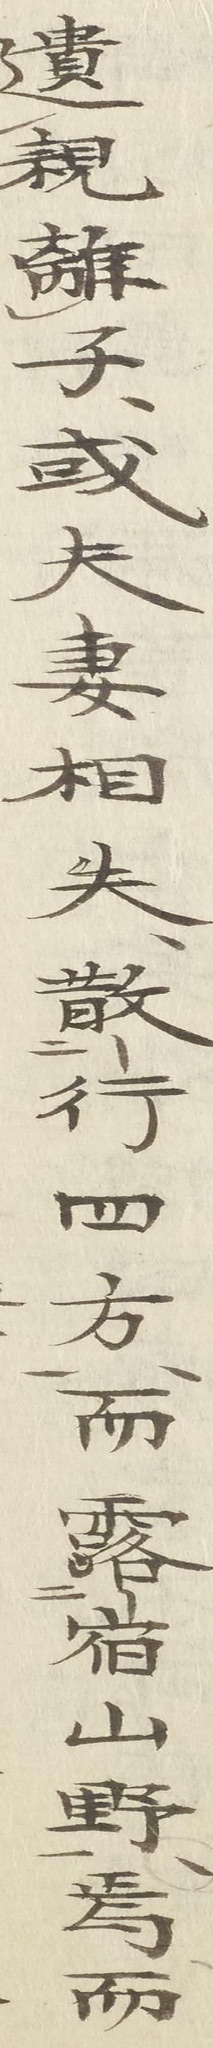遺親離子、或夫婦相失、散ー行四方、而露宿山野、焉而

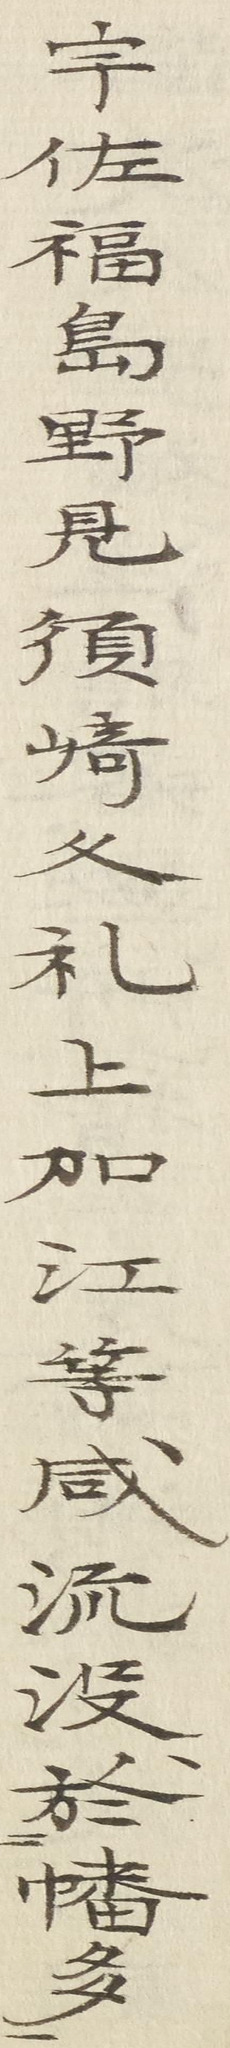宇佐福島野見須崎久礼上加江等、咸流没、於幡多
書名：地震記　下
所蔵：東京大学地震研究所図書室 Earthquake Research Institute Library, The University of Tokyo, JAPAN
